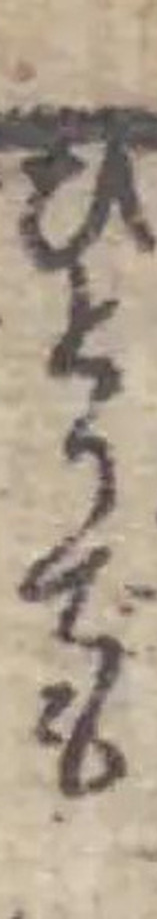ひとりでも
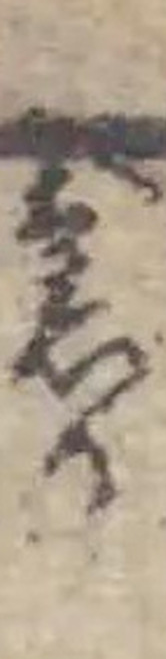おしり
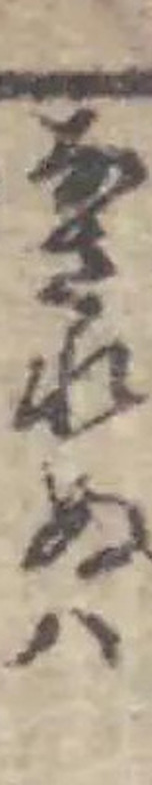なされぬは
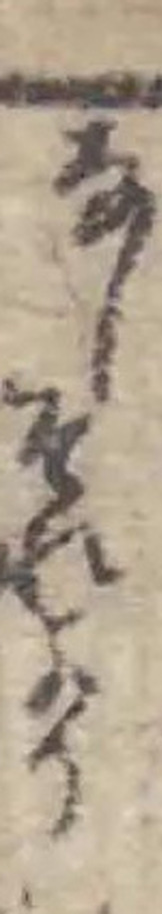なしそれより
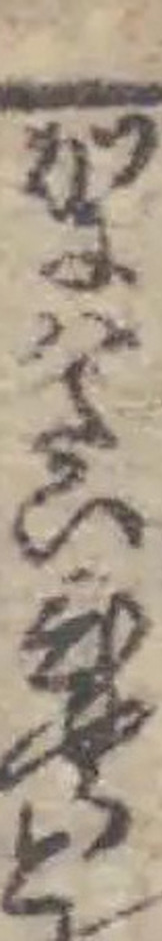かにはたいひやうと
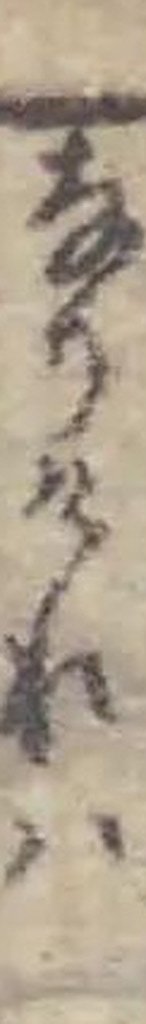なりけれは
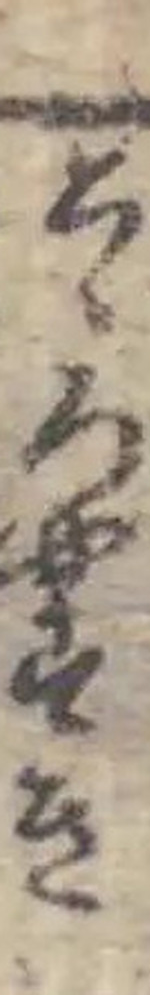こゝろやすき
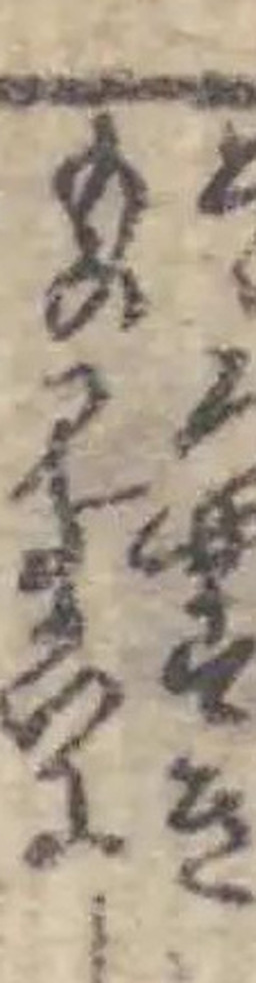もの見まいに
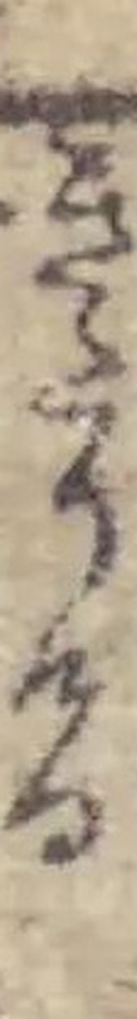きたりける
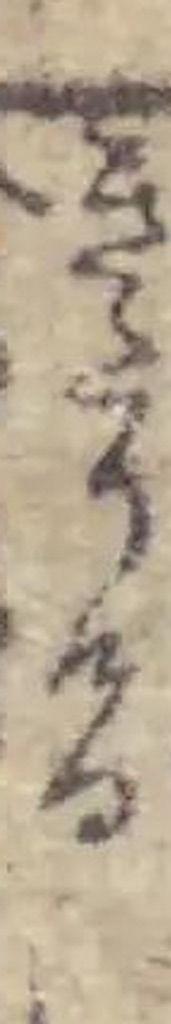きたりける
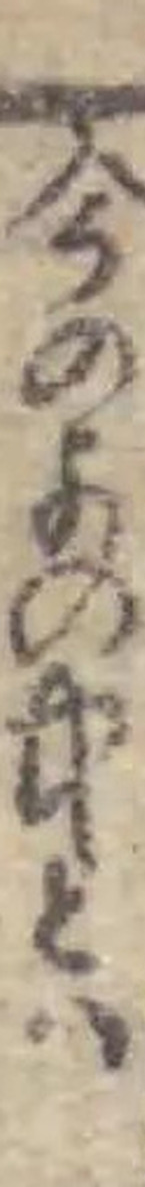今のよの中とは
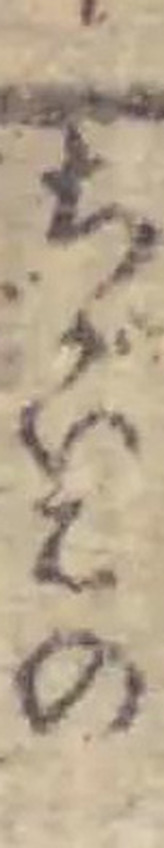ちがいこの
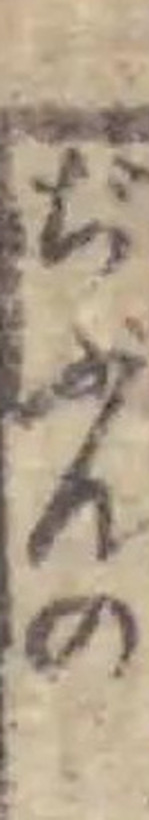ぢぶんの
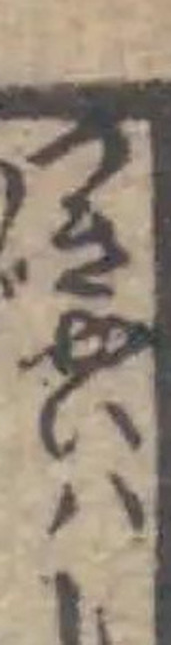つきやいは
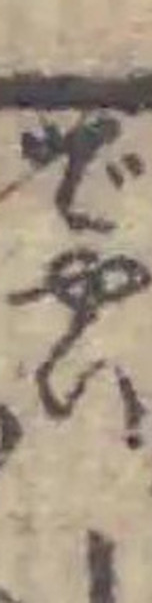でやい
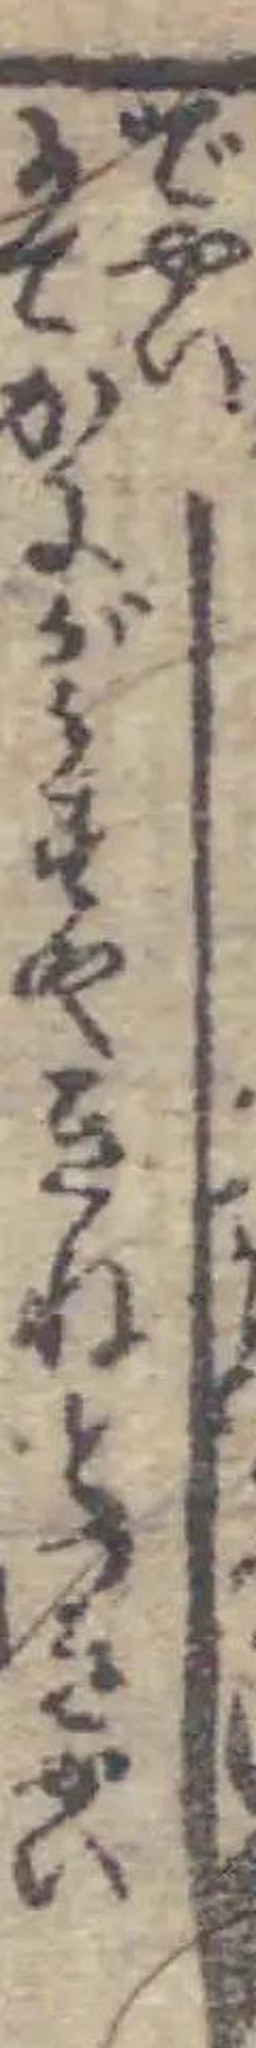にてかにがうすやきねとつきやい
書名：蟹牛房挟多 3巻
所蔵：国立国会図書館 National Diet Library, JAPAN
